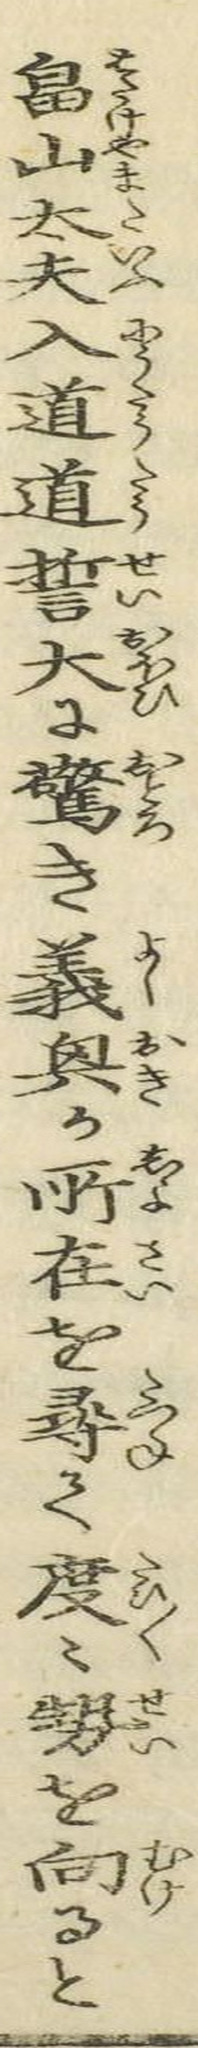畠山太夫入道道誓大に驚き義興か所在を尋て度々㔟を向ると
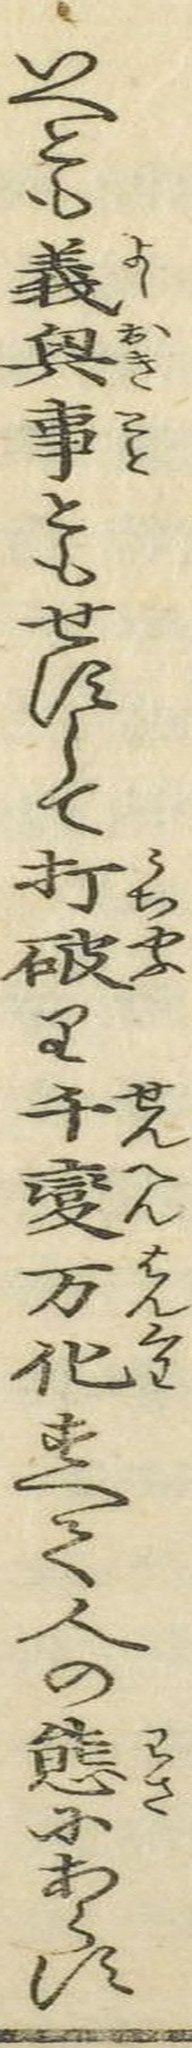いへとも義興事ともせすして打破り千變万化すへて人の態にあらす
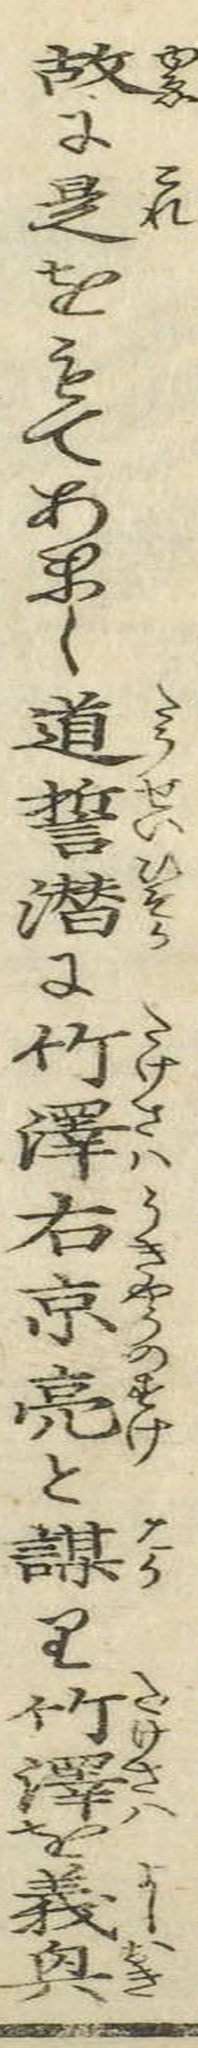故に是をもてあまし道誓潜に竹澤右京亮と謀り竹澤を義興
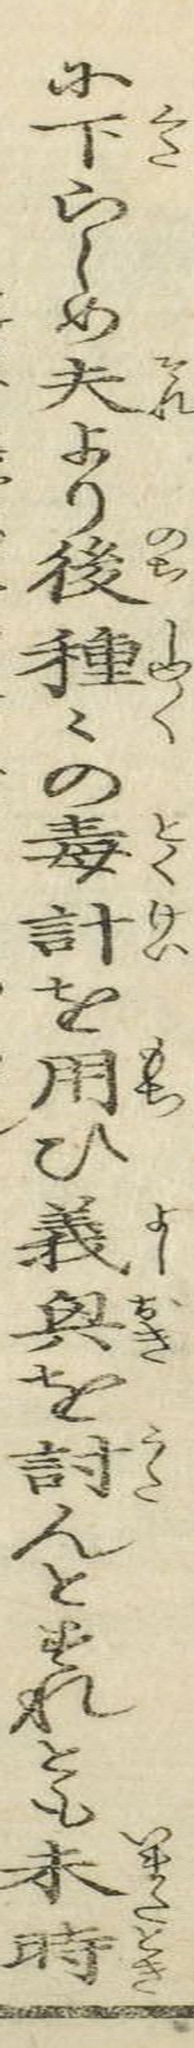に下らしめ夫より後種々の毒計を用ひ義興を討んとすれとも未時
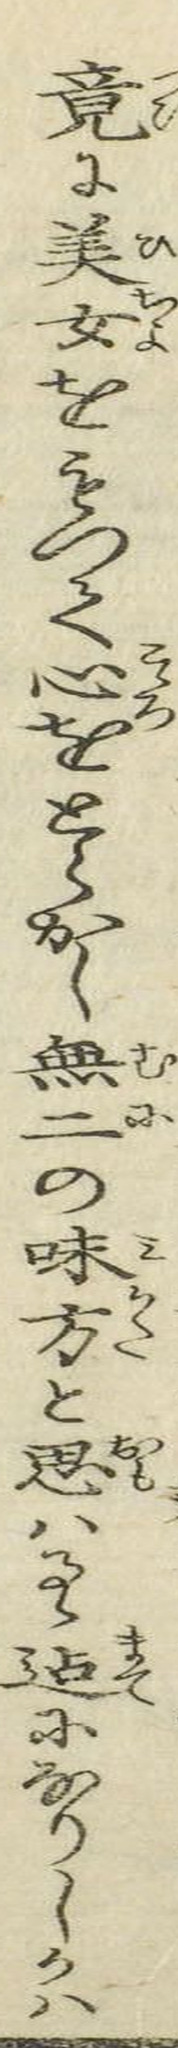竟に美女をもつて心をとかし無二の味方と思はるゝ迠になりしかは
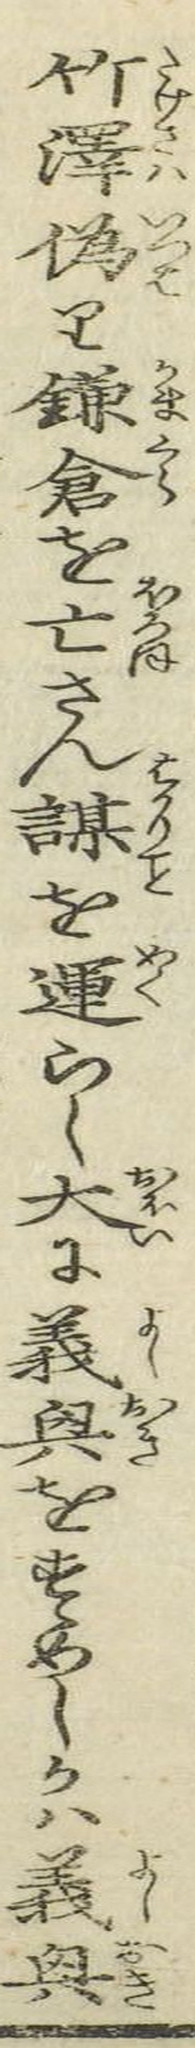竹澤偽り鎌倉を亡さん謀を運らし大に義興をすめしかは義興
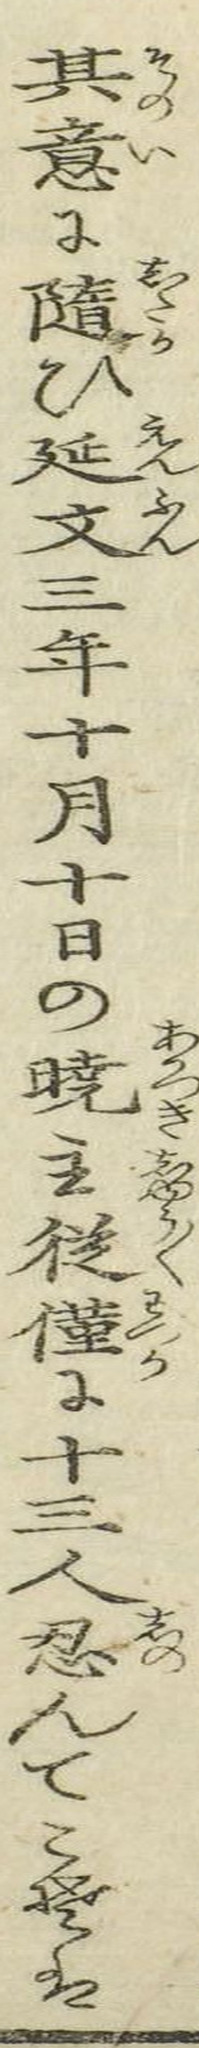其意に隨ひ延文三年十月十日の暁主従僅に十三人忍んてこそは
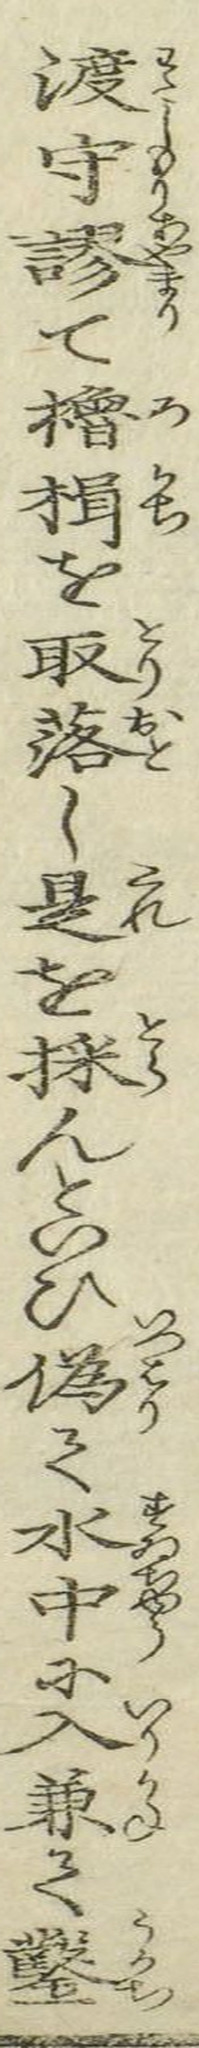渡守謬て櫓楫を取落し是を採んといひ偽て水中に入兼て鑿
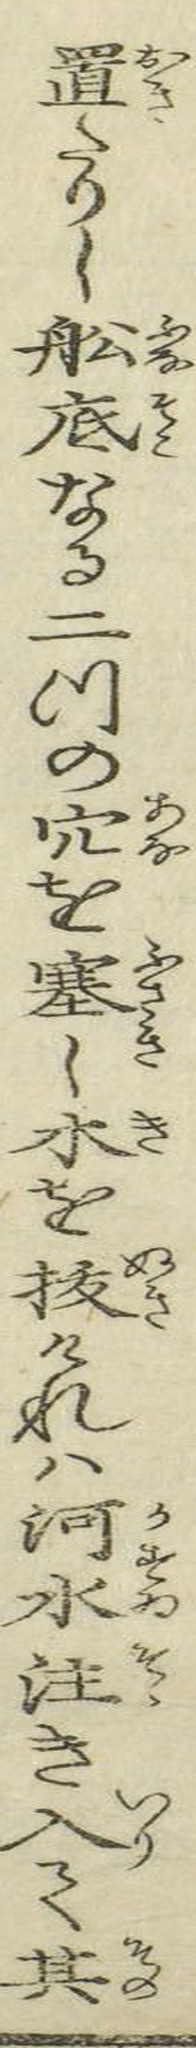置たりし舩底なる二つの穴を塞し木を抜けれは河水注き入て其
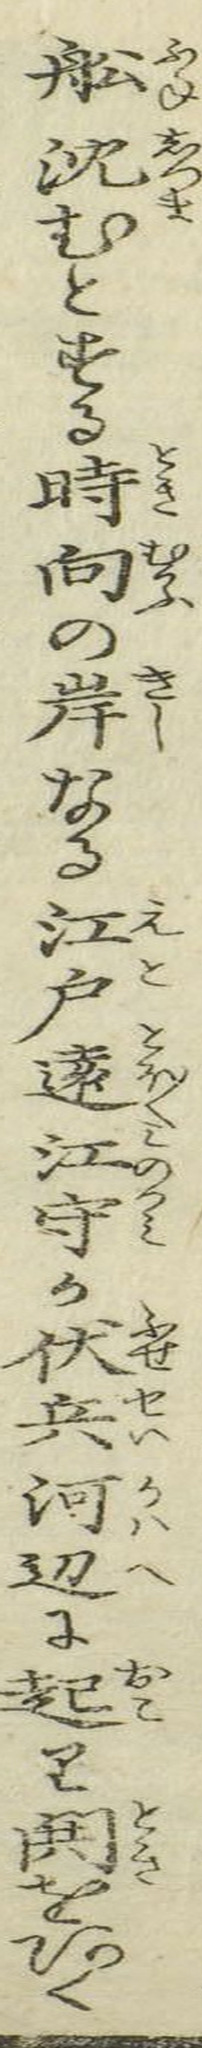舩沈むとする時向の岸なる江戸遠江守か伏兵河辺に起り閧をあく
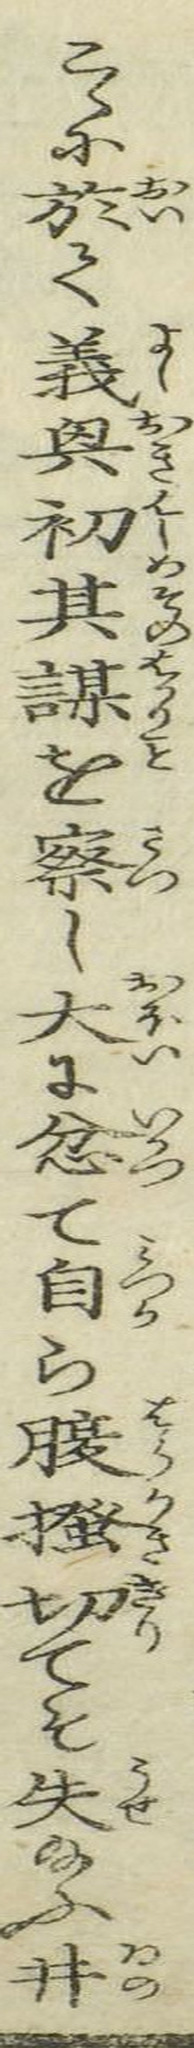こゝに於て義興初其謀を察し大に忿て自ら腹搔切てそ失給ふ井
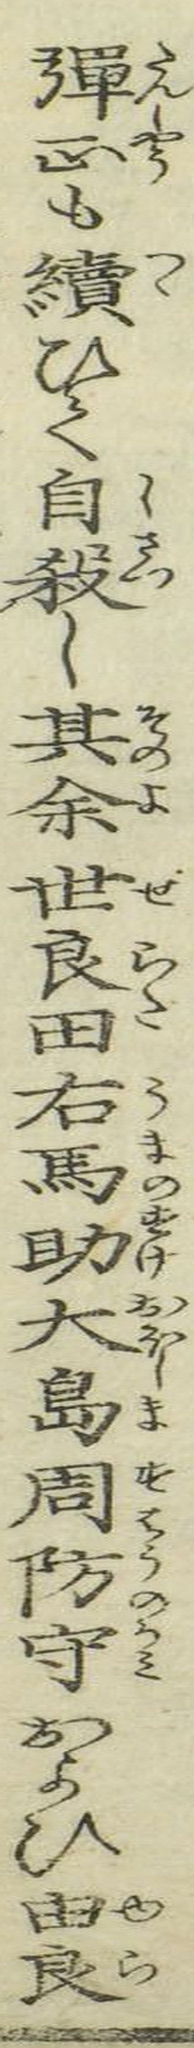彈正も續ひて自殺し其余世良田右馬助大島周防守およひ由良
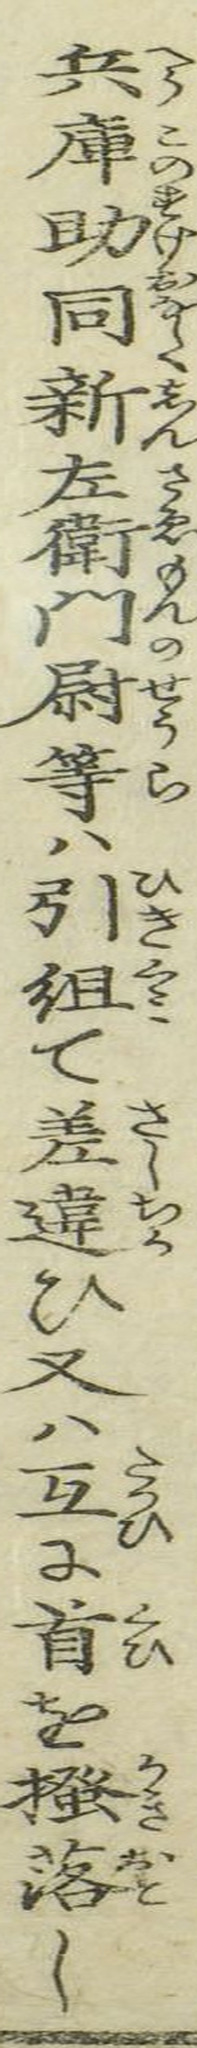兵庫助同新左衛門尉等は引組て差違ひ又は互に首を掻落し

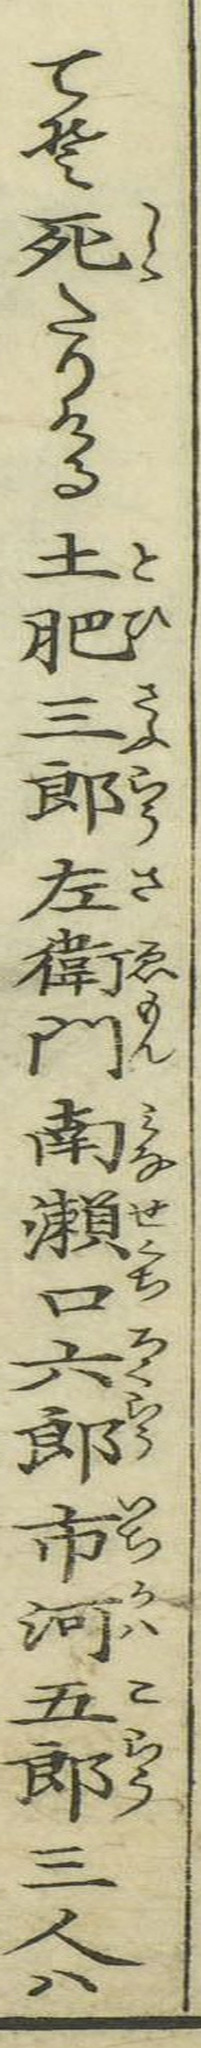てそ死たりける土肥三郎左衛門南瀬口六郎市河五郎三人は
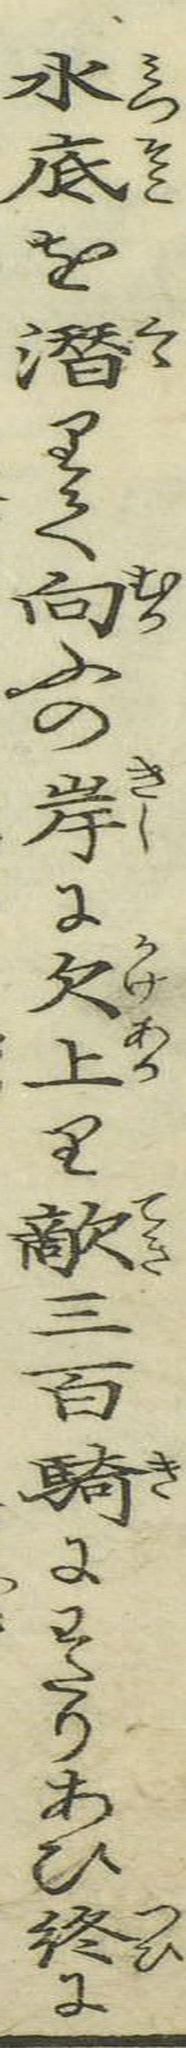水底を潜りて向ふの岸に欠上り敵三百騎にわたりあひ終に
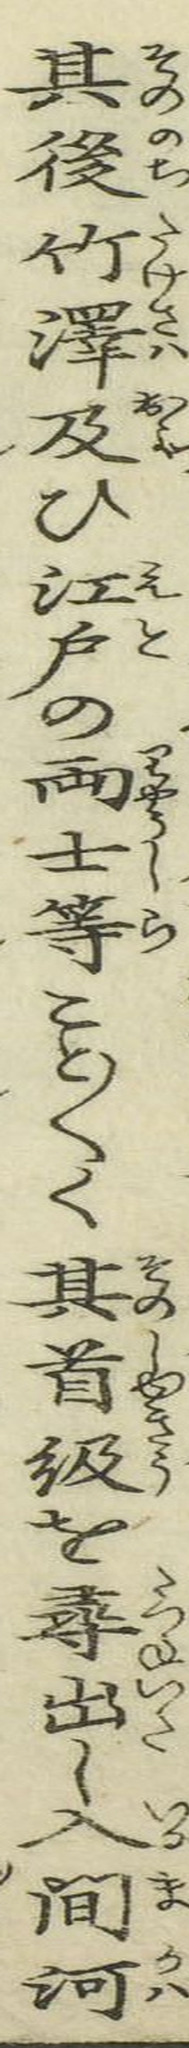其後竹澤及ひ江戸の両士等こと〳〵く其首級を尋出し入間河
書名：江戸名所図会 20巻 巻之4
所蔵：東京学芸大学教育コンテンツアーカイブ
